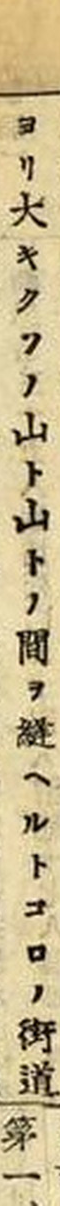ヨリ大キクソノ山ト山トノ間ヲ縫ヘルトコロノ街道
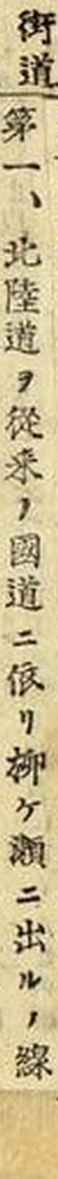第一、北陸道ヲ從來ノ國道ニ依リ柳ケ瀬ニ出ルノ線
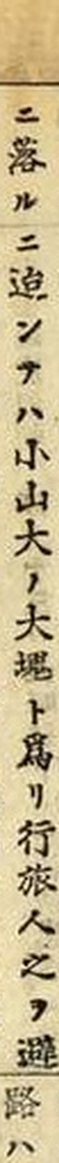ニ落ルニ迨ンテハ小山大ノ大塊ト爲リ行旅人之ヲ避
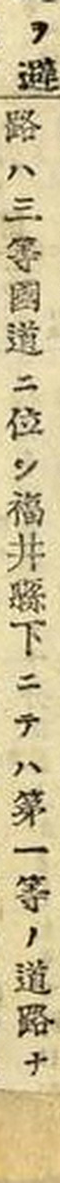路ハ三等國道ニ位シ福井縣下ニテハ第一等ノ道路ナ
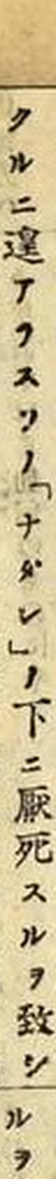クルニ遑アラスソノ「ナダレ」ノ下ニ壓死スルヲ致シ
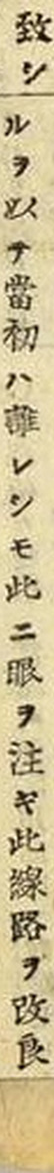ルヲ以テ當初ハ誰レシモ此ニ眼ヲ注ギ此線路ヲ改良
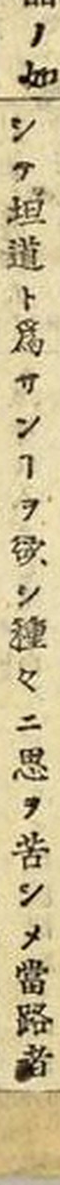シテ坦道ト爲サンヿヲ欲シ種々ニ思ヲ苦シメ當路者
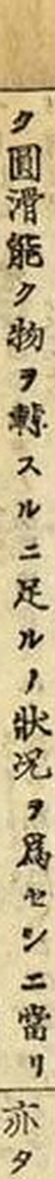又タ圓滑能ク物ヲ轉スルニ足ルノ狀況ヲ爲セシニ當リ
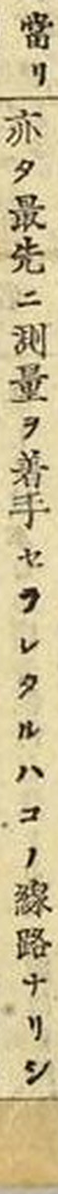亦タ最先ニ測量ヲ着手セラレタルハコノ線路ナリシ
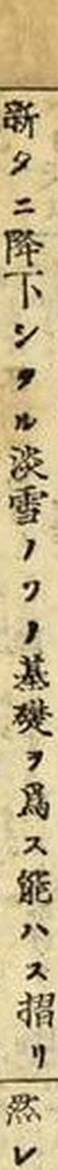新タニ降下シタル淡雪ノソノ基礎ヲ爲ス能ハス摺リ
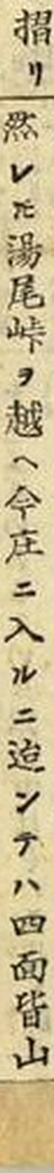然レ𪜈湯尾峠ヲ越ヘ今庄ニ入ルニ迨ンテハ四面皆山
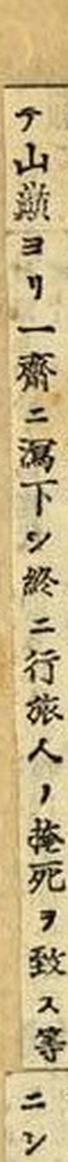テ山巓ヨリ一齊ニ瀉下シ終ニ行旅人ノ掩死ヲ致ス等
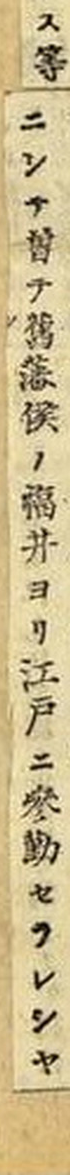ニシテ曾テ舊藩侯ノ福井ヨリ江戸ニ参勤セラレシヤ

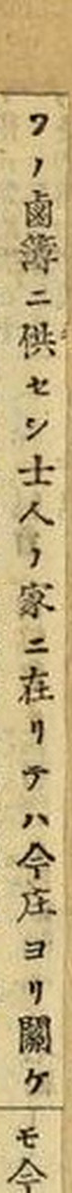ソノ鹵簿ニ供セシ士人ノ家ニ在リテハ今庄ヨリ關ケ
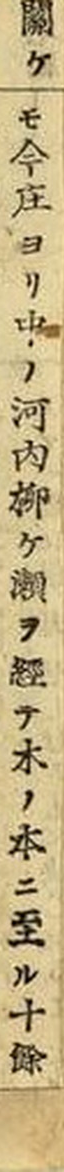モ今庄ヨリ中ノ河内柳ケ瀬ヲ經テ木ノ本ニ至ル十餘
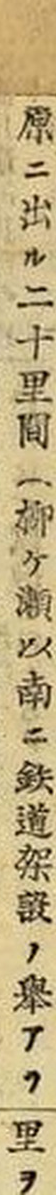原ニ出ル二十里間柳ケ瀬以南ニ鉄道架設ノ擧アラ
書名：温古集 五巻
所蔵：福井県文書館 Fukui Prefectural Archives
